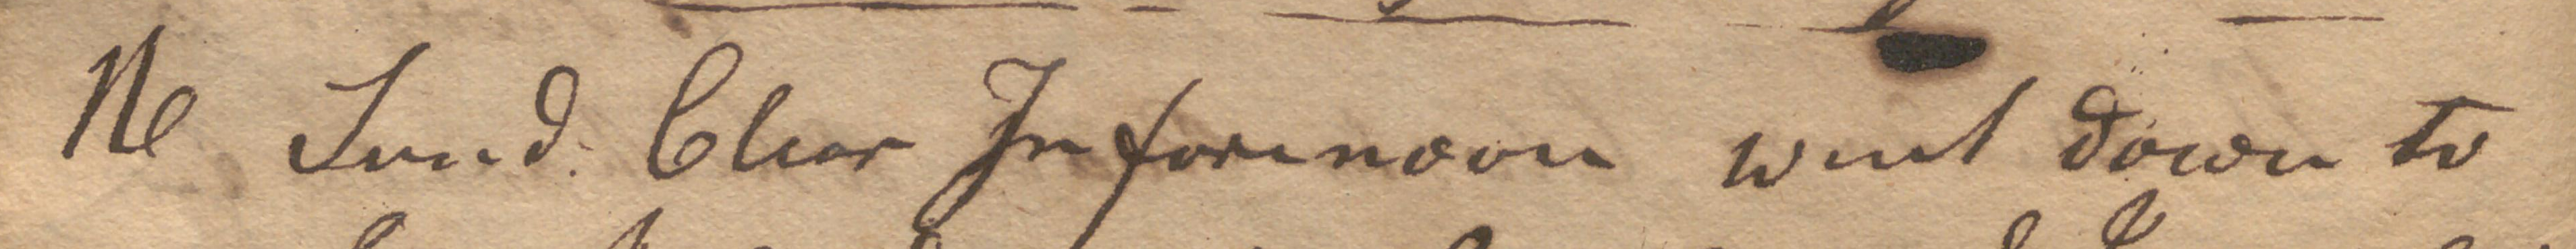16 Sund Clear In forenoon went down to
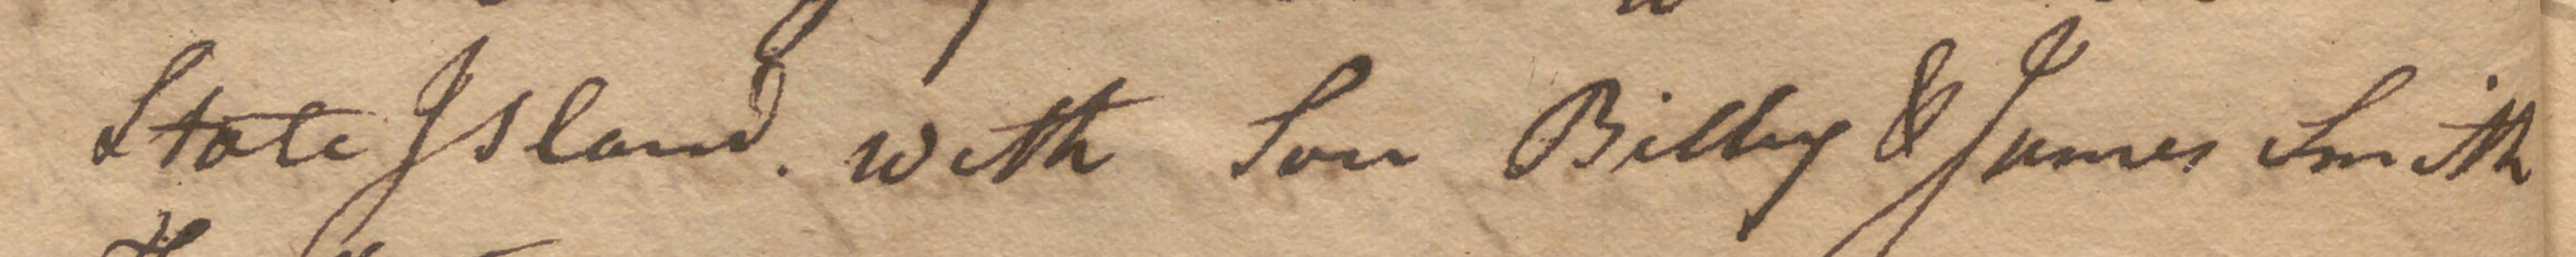State Island with Son Billey & James Smrith
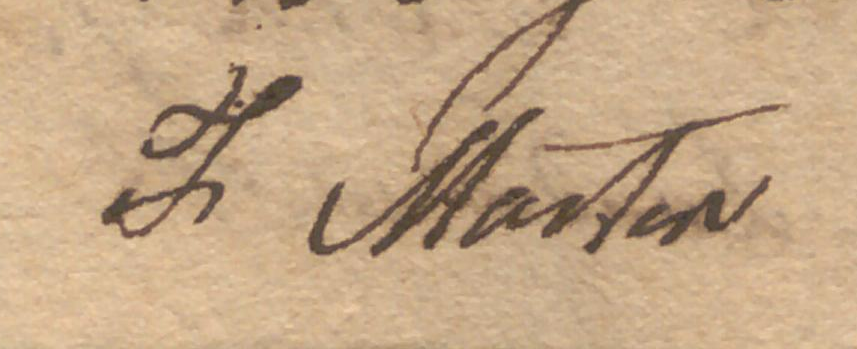F Marten
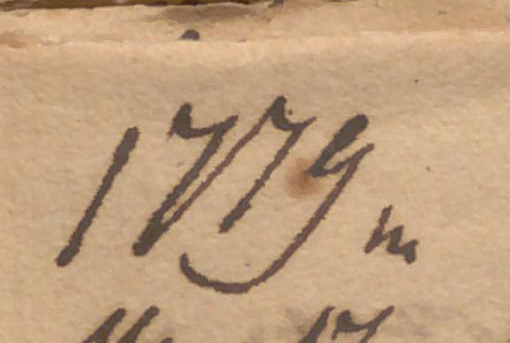1779
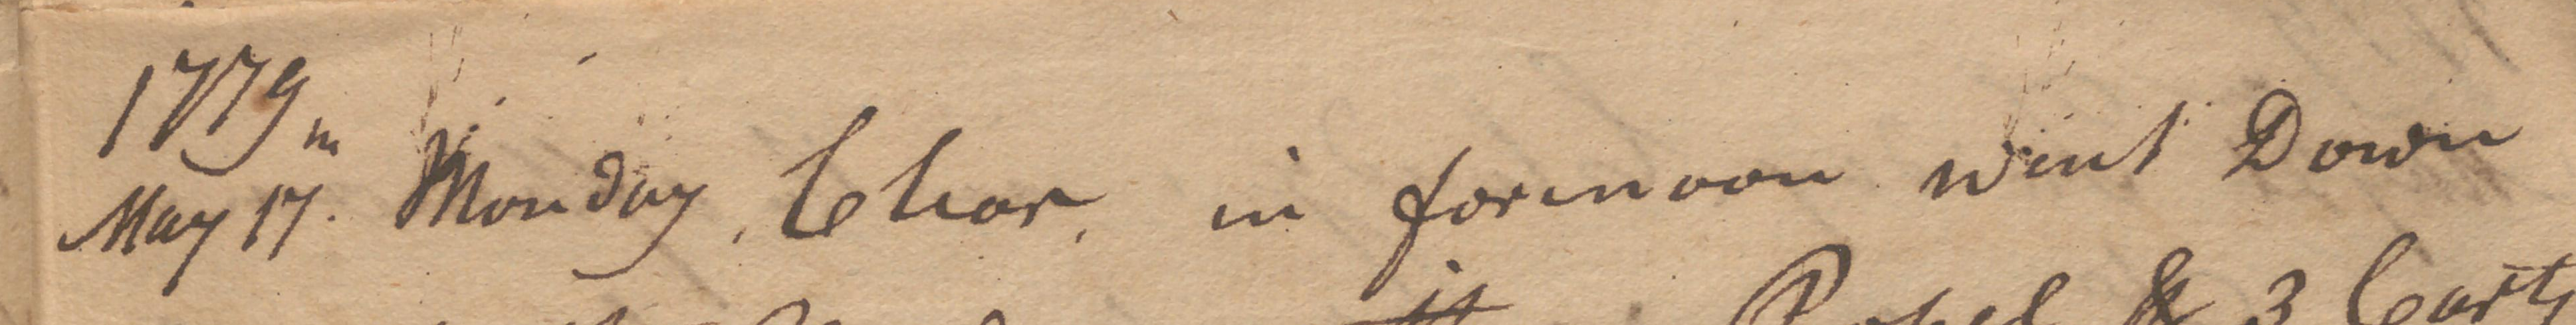May 17^th. Monday Clear, in forenoon went Down
